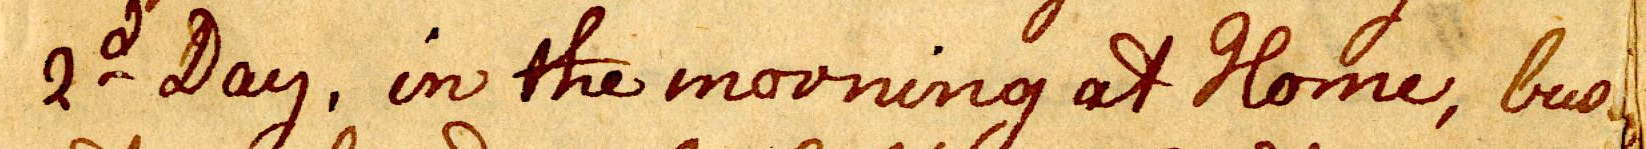2^d Day, in the morning at Home, bus
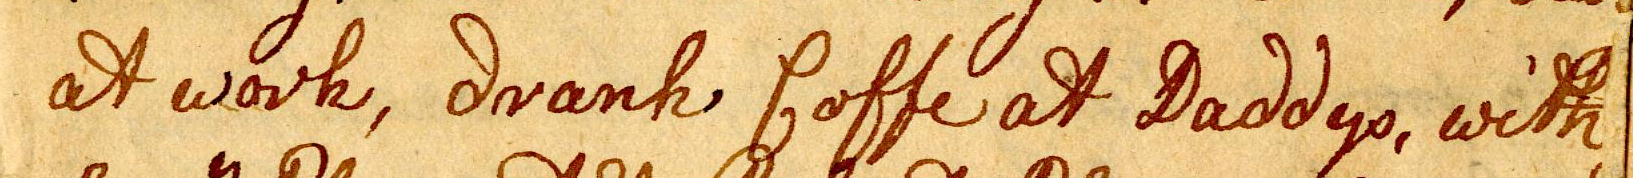at work, drank Coffe at Daddys, with
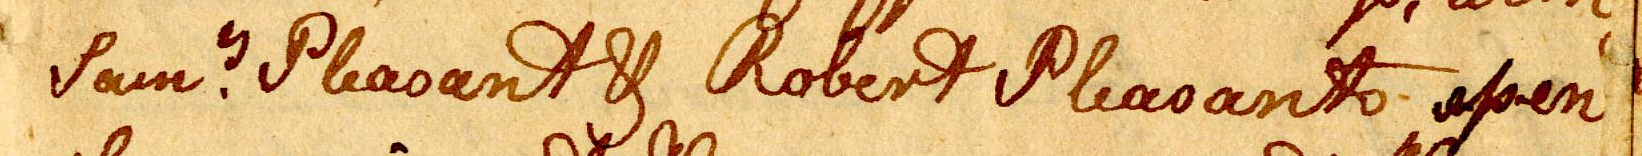Sam^y Pleasant & Robert Pleasants spent
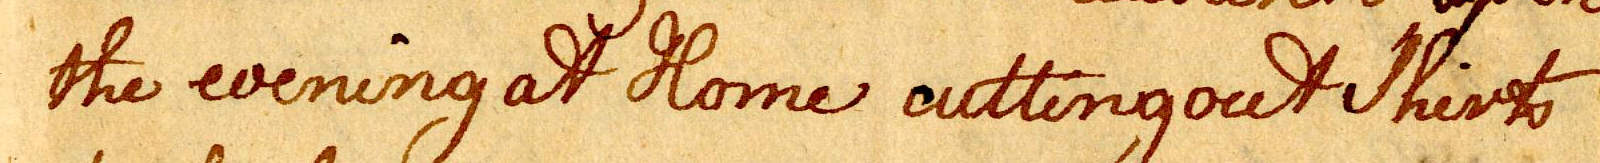the evening at Home cutting out shirts
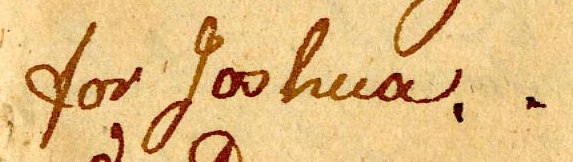for Joshua .-
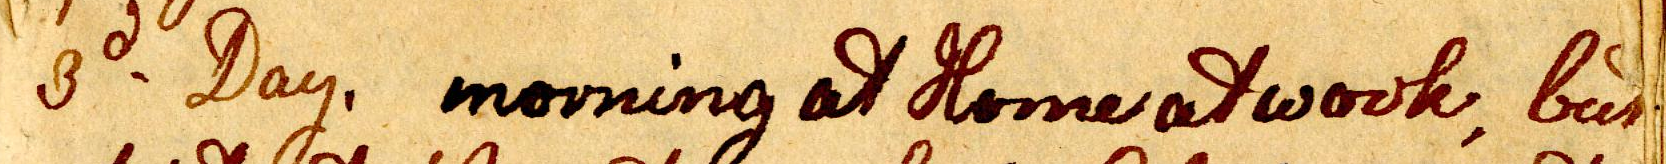3^d Day. morning at Home at work, but
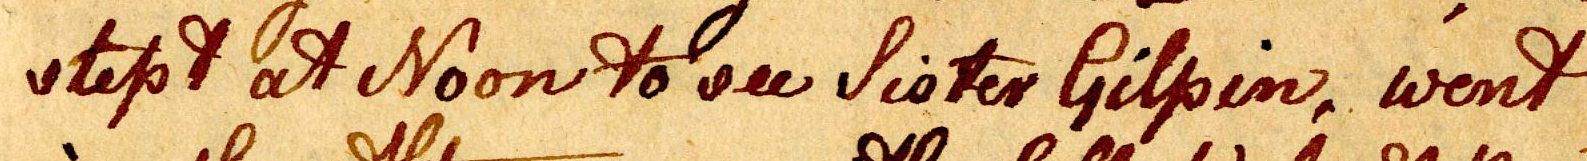stept at Noon to see Sister Gilpin, went
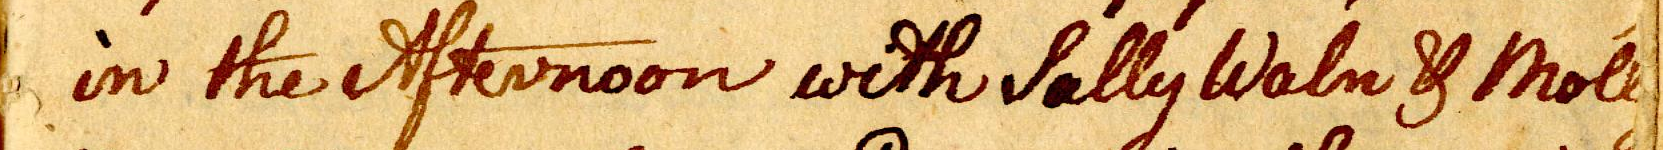in the Afternoon with Sally Waln & Molly
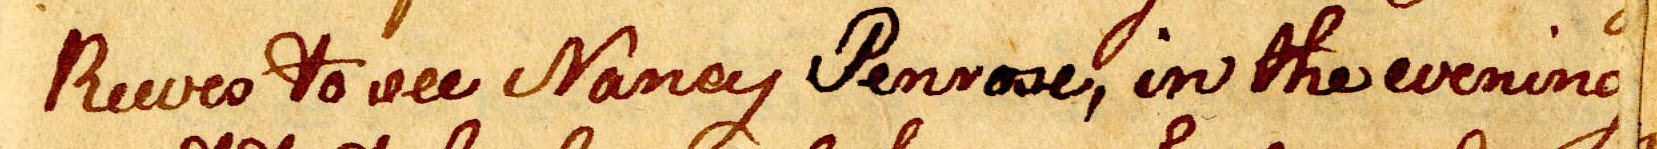Reeves to see Nancy Penrose, in the evening
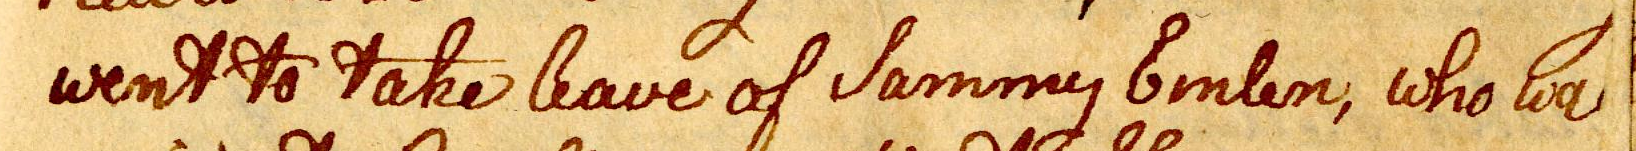went to take leave of Sammy Emlen, who was
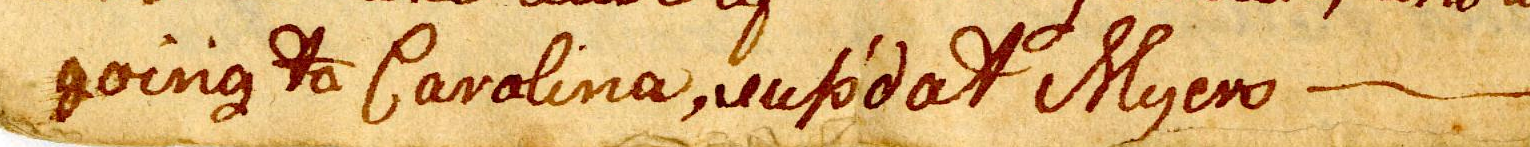going to Carolina, sup'd at Myers -
